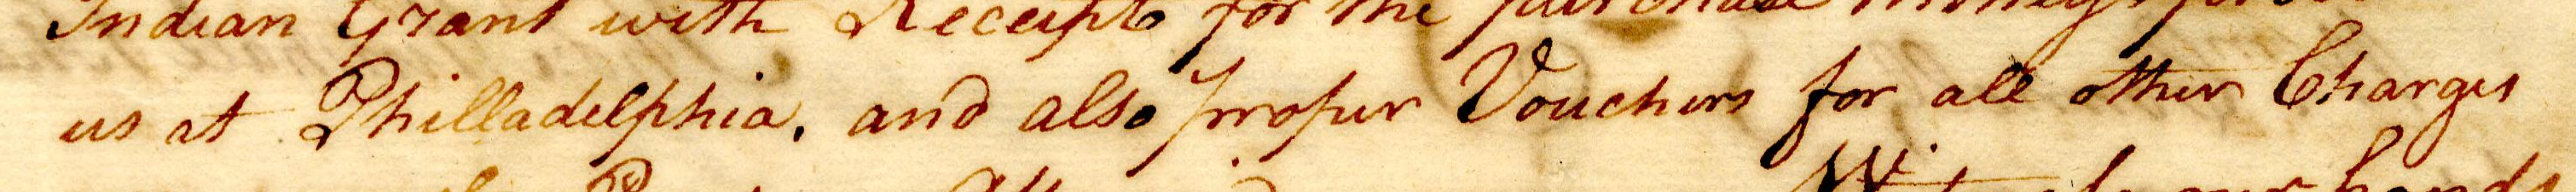us at Philadelphia, and also proper Vouchers for all other Charges
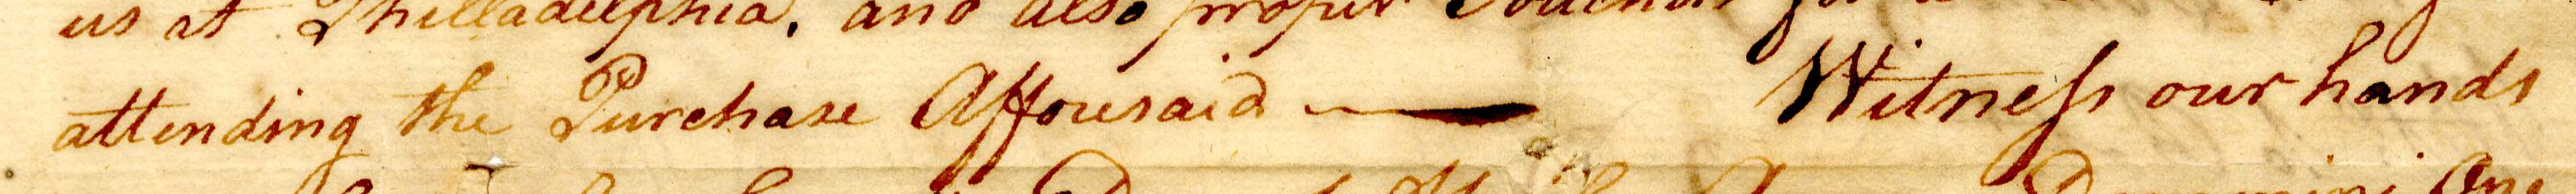attending the Purchase Afforsaid.- Witness our hands
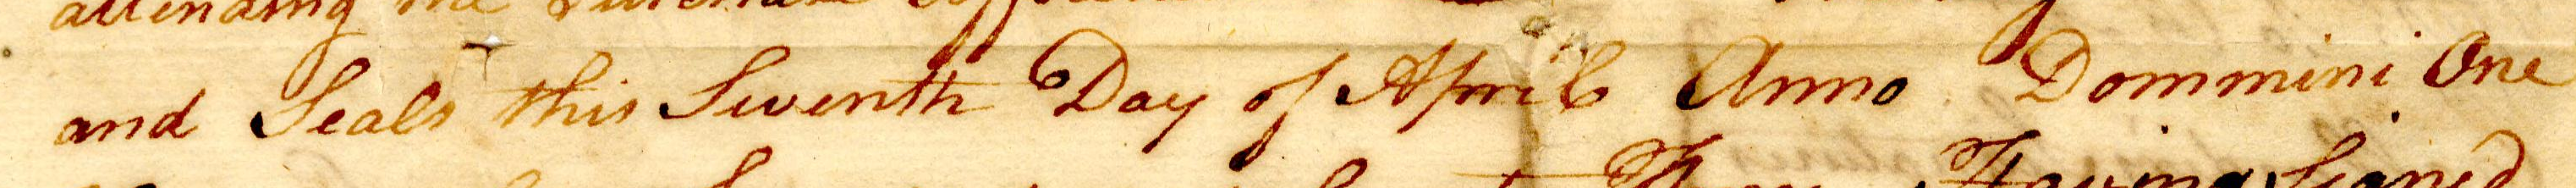and Seals this Seventh Day of April Anno Dommini one
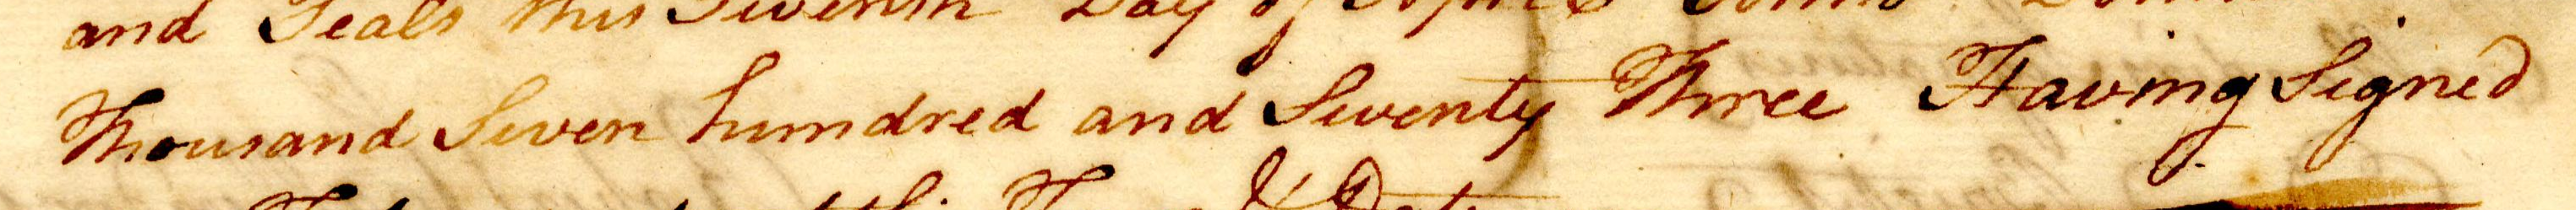Thousand Seven hundred and Seventy Three Having Signed
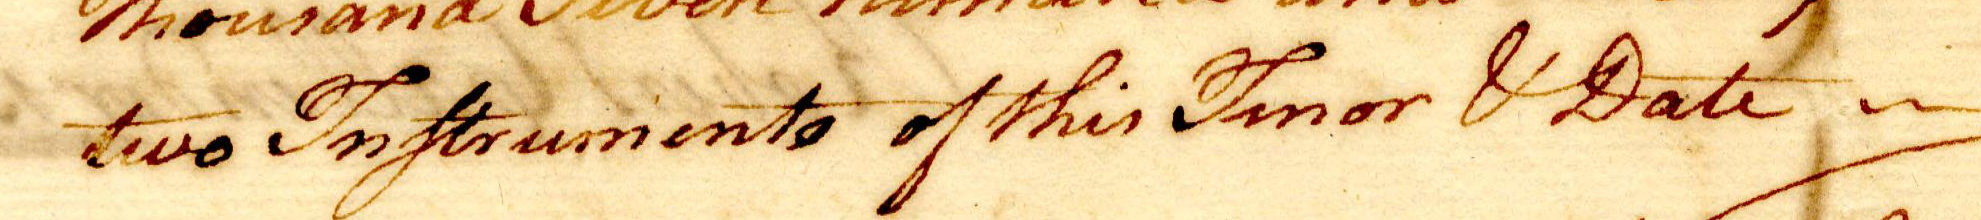two Instruments of this Tenor & Date-
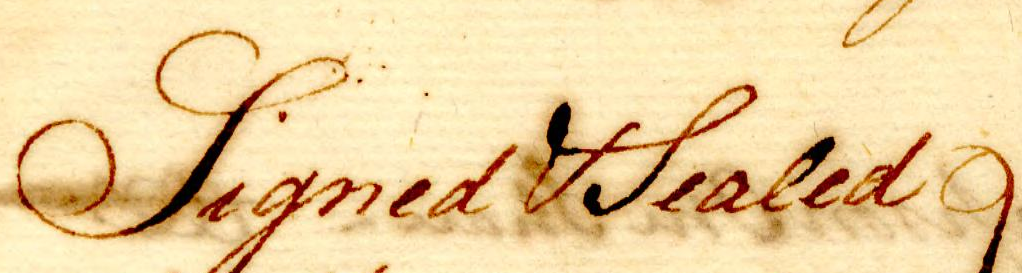Signed & Sealed
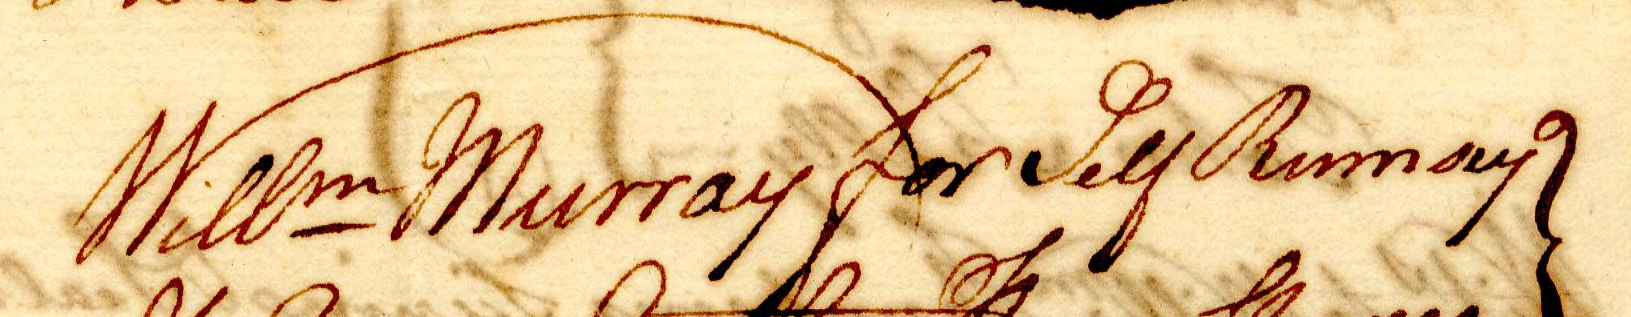Will^m. Murray for Self Rumsey
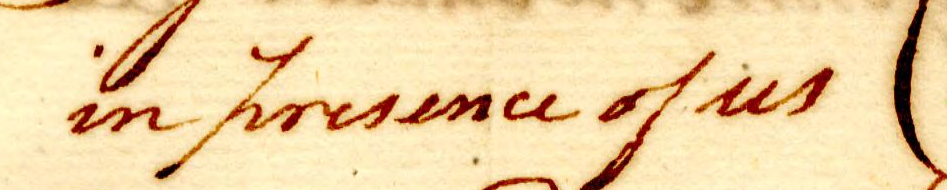in presence of us
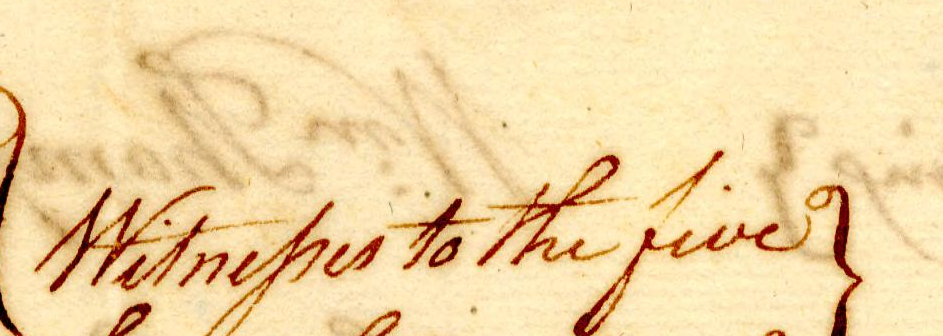Witness to the five
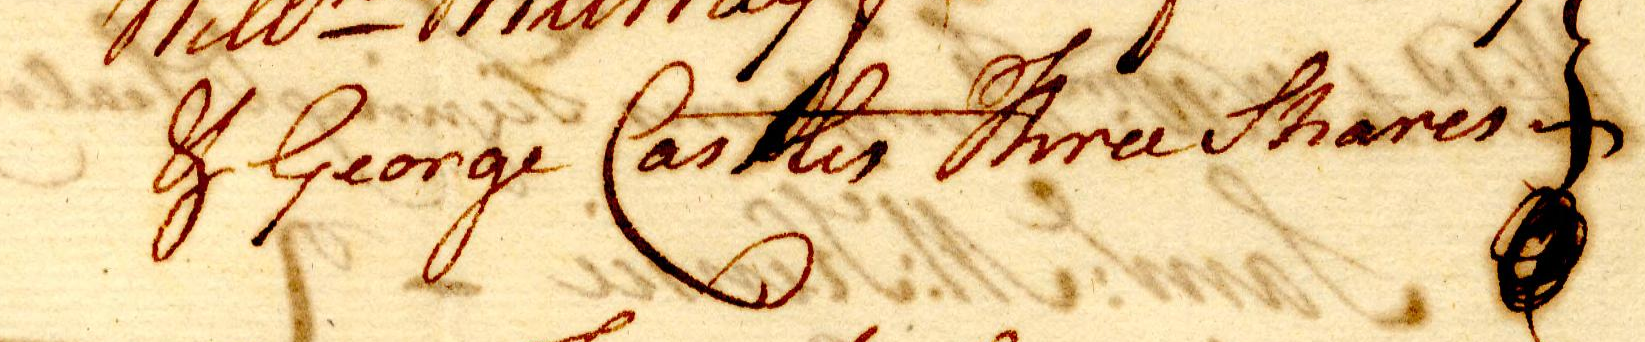& George Castles Three Shares
